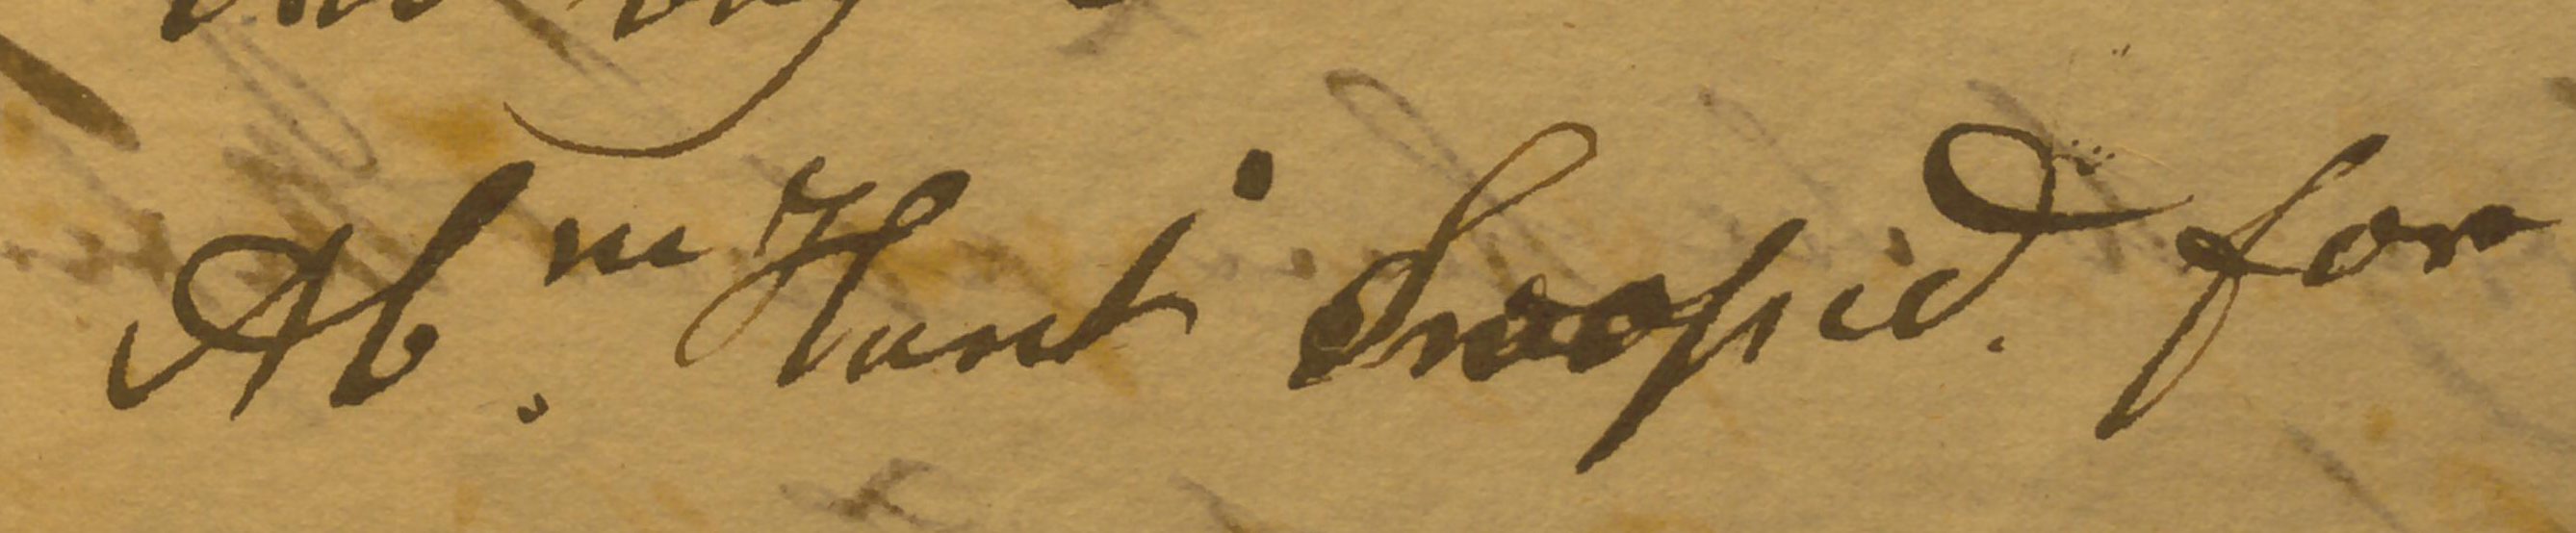Ab^m Hunt Trooped for
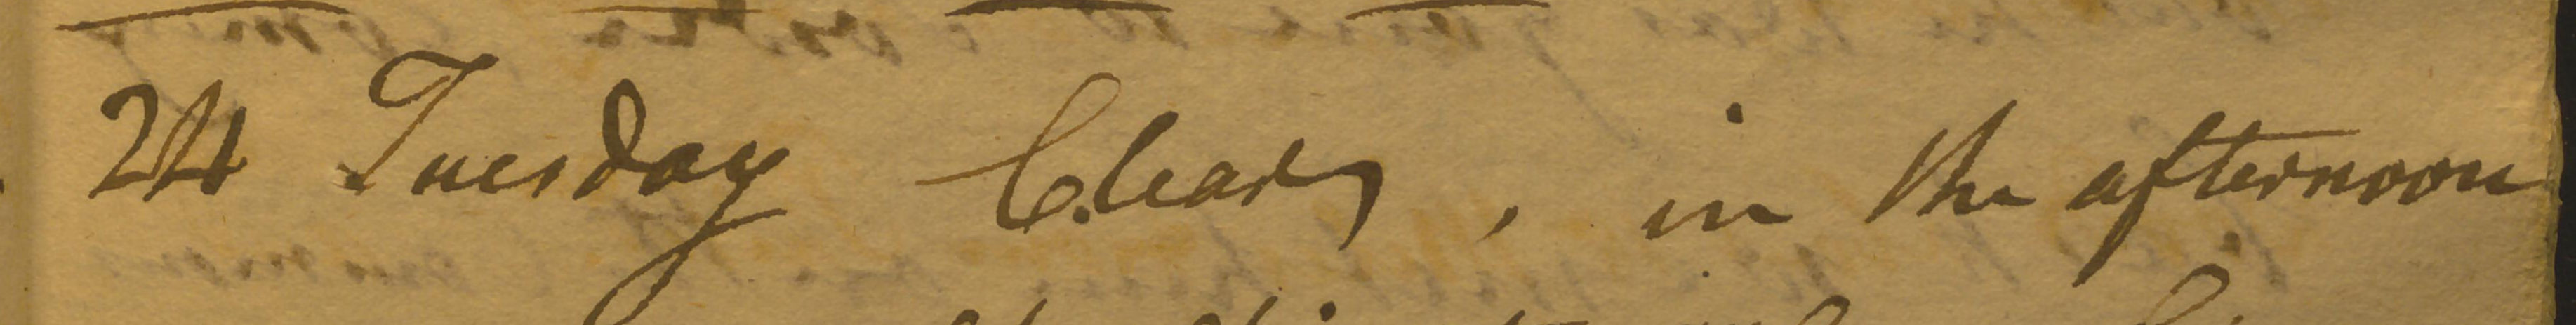24 Tuesday Clear, in the afternoon
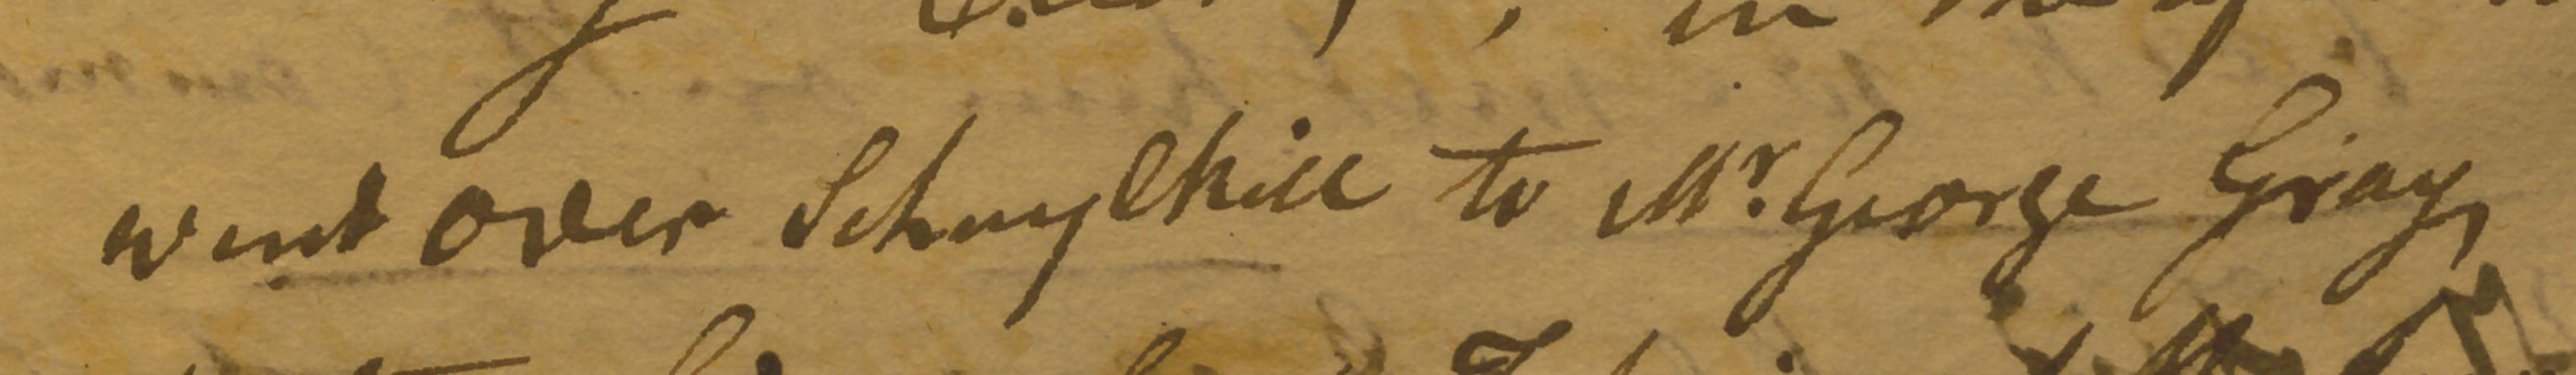went over Schuylkill to M^r. George Gray
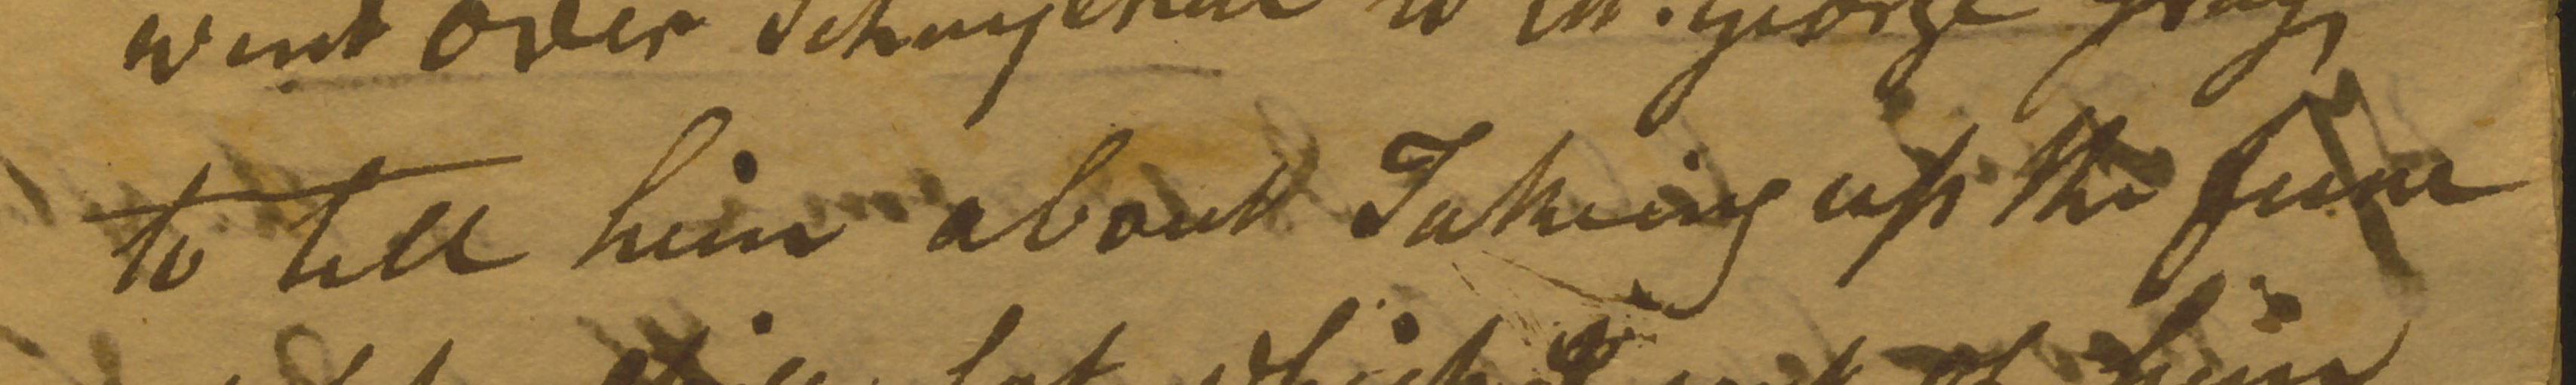to tell hem about Takeing up the fine
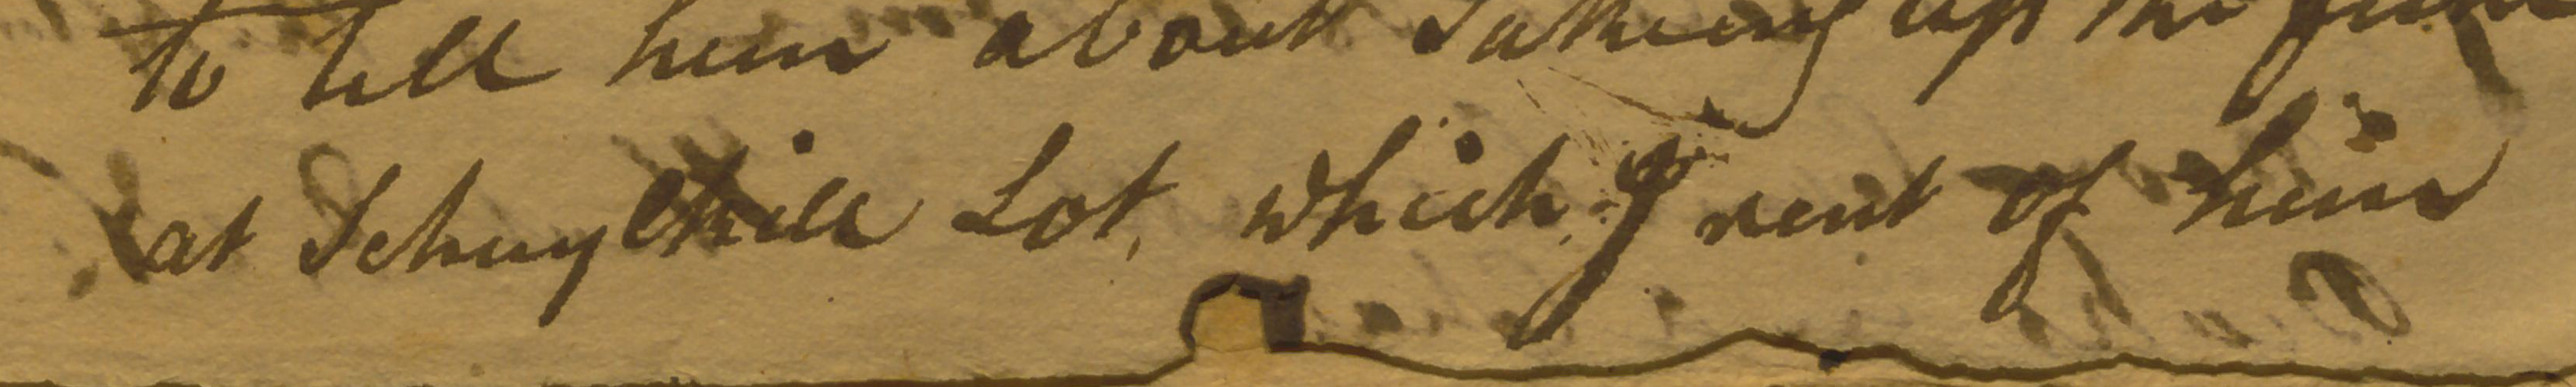at Schuylkill Lot, which I rent of him
